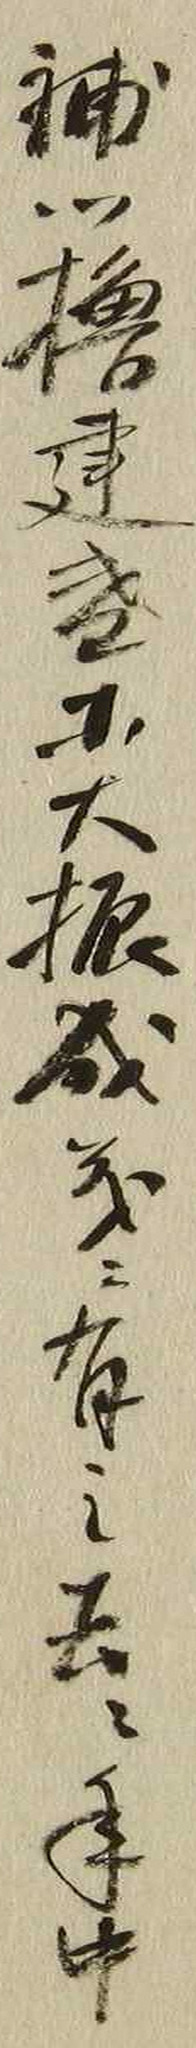補御櫓建替抔大振成義ニ有之去々年中
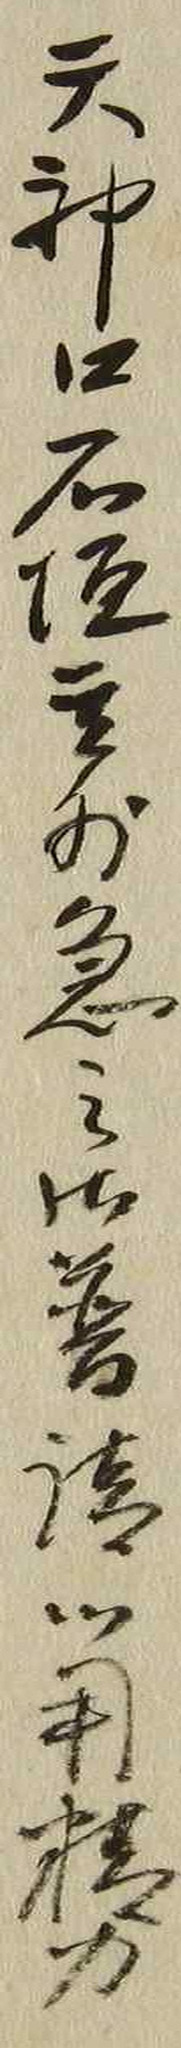天神口石垣其外急之御普請御用精力
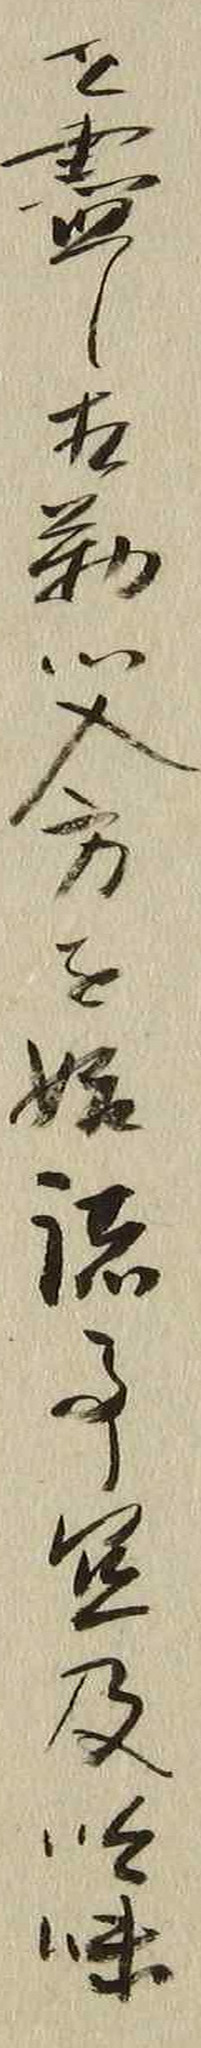を盡し相勤御入方を始諸事宜及吟味
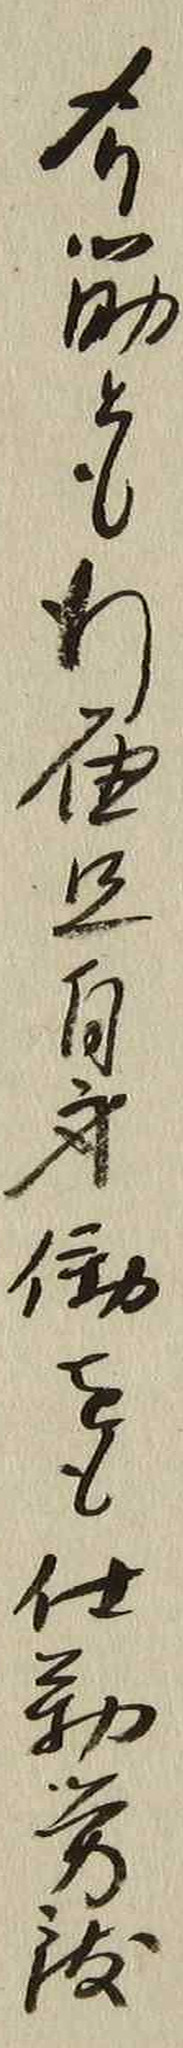〆リ筋とも行届旦自身働をも仕勤労致
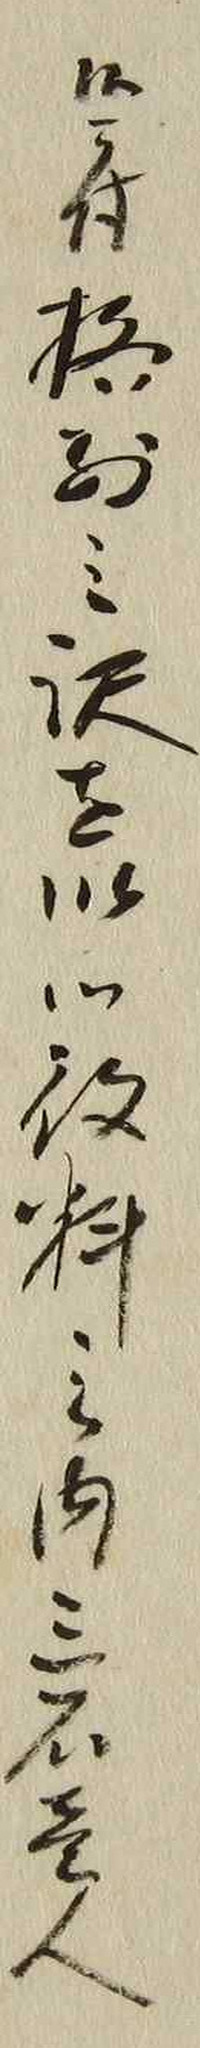候ニ付橋格別之訳を以御役料之内三石壱人
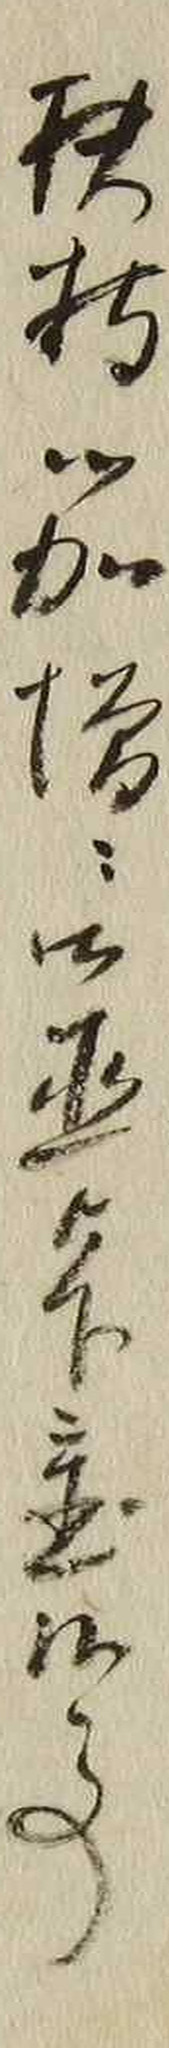扶持御加増ニ御直被下置候事
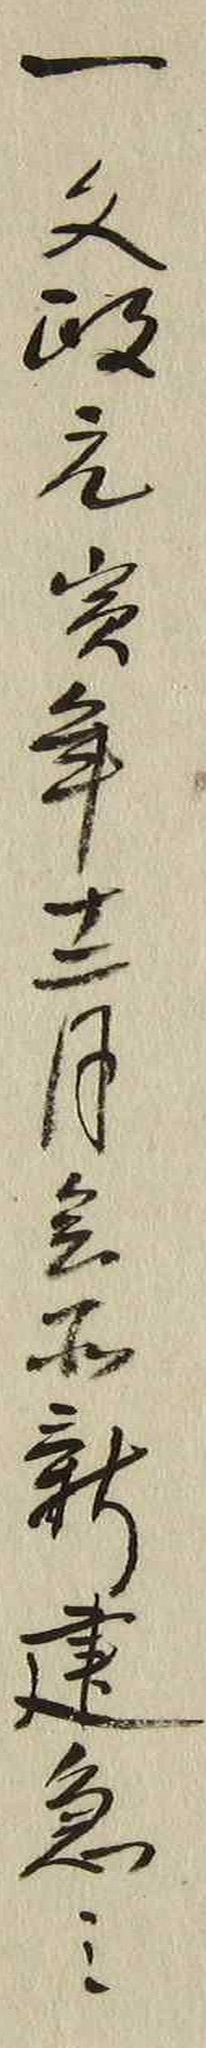一文政元寅年十二月会所新建急之
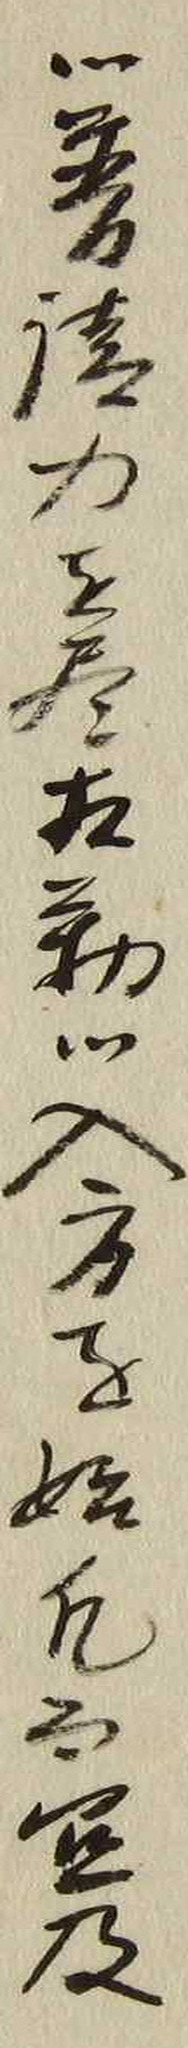御普請力を尽相勤御入方を始凡而宜及
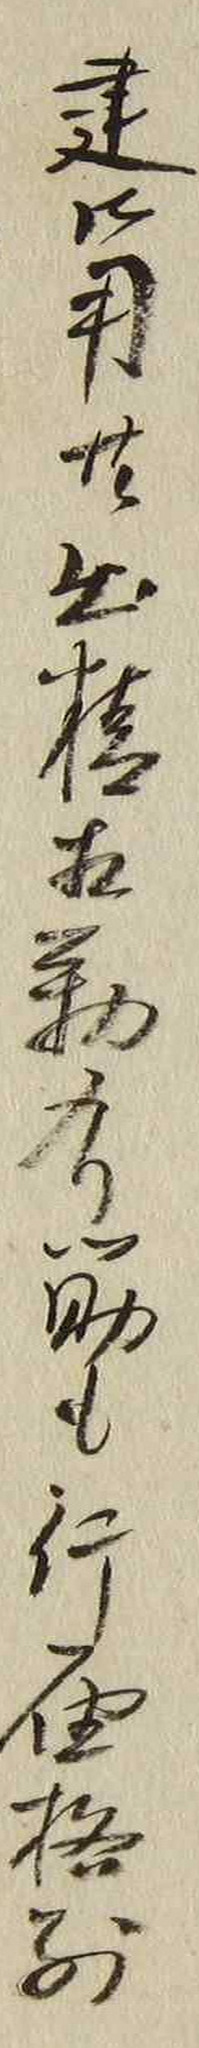建御用共出精相勤〆り筋も行届格別
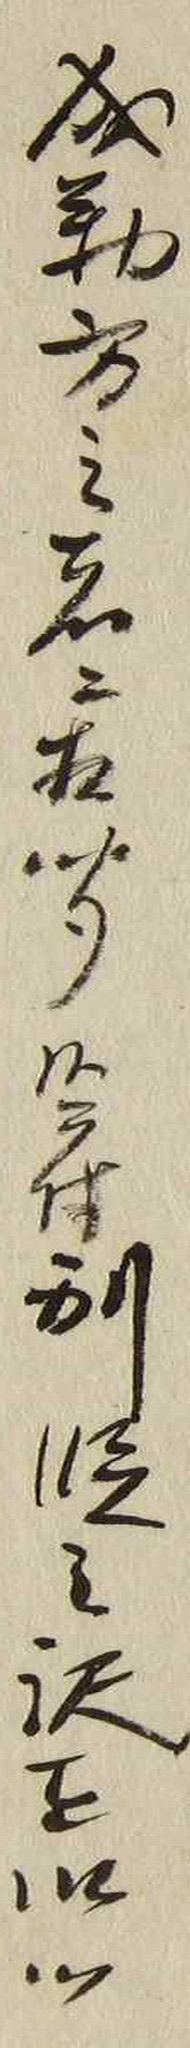成勤方之者ニ相聞候ニ付別段之訳を以御
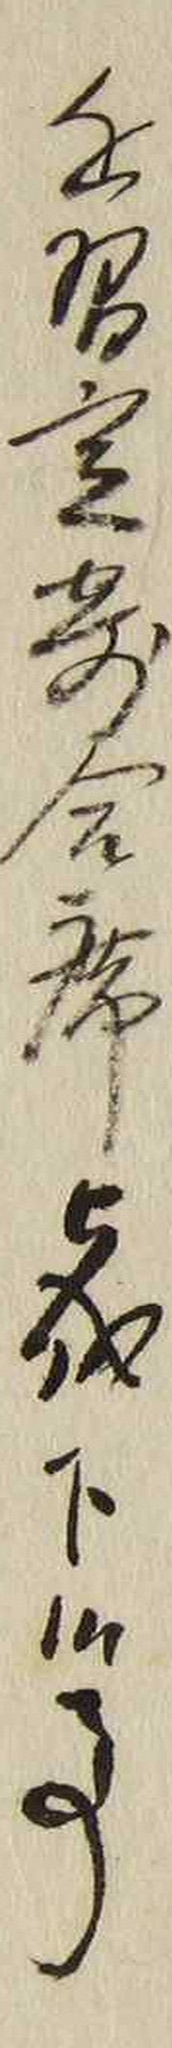近習定寄合席被成下候事
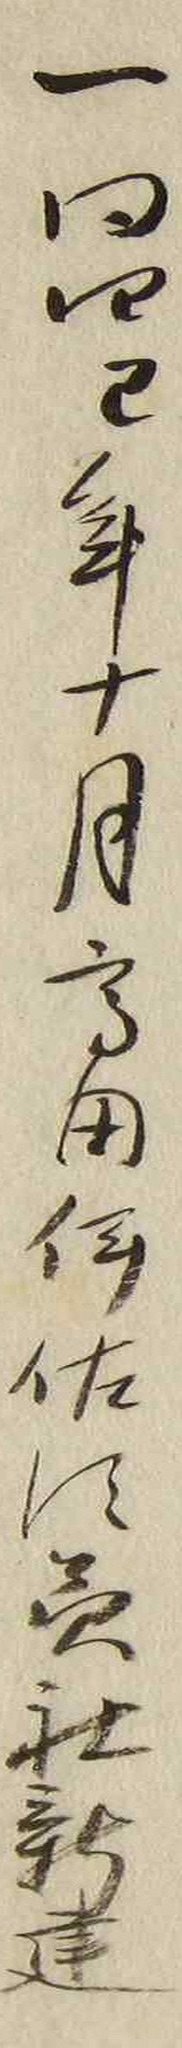一同四巳年十月高田伊佐須美社新建

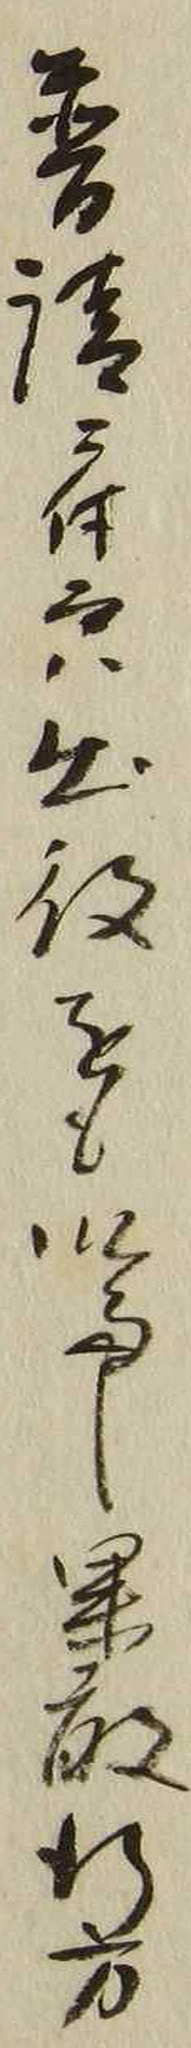普請ニ付而ハ出役をもいたし果敢行方
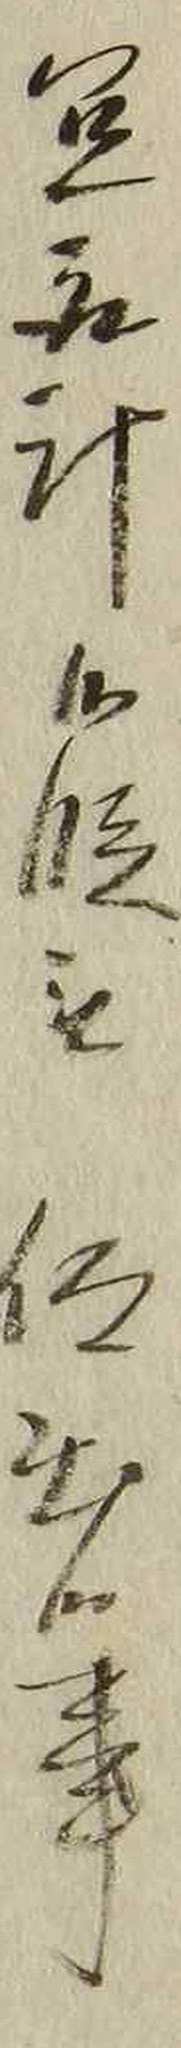宜取計候段被仰出候事
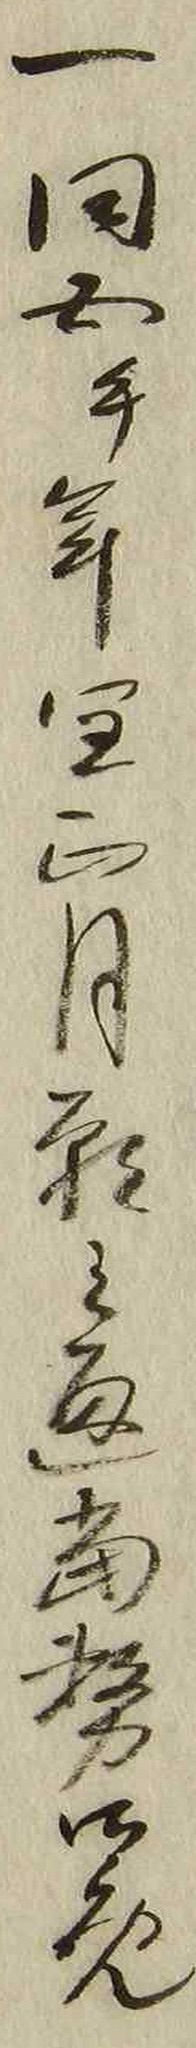一同五午年閏正月願之通当務御免
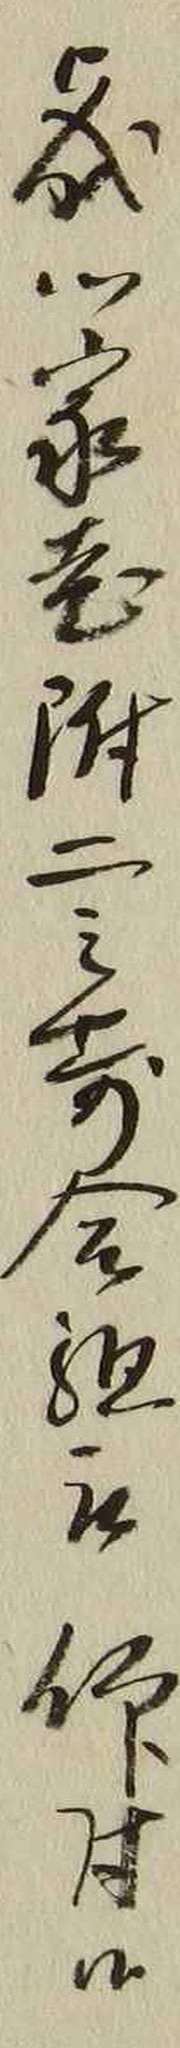被成御家老附二之寄合組被仰付候
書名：諸士系譜　巻之360　す之部10
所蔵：会津若松市立会津図書館
